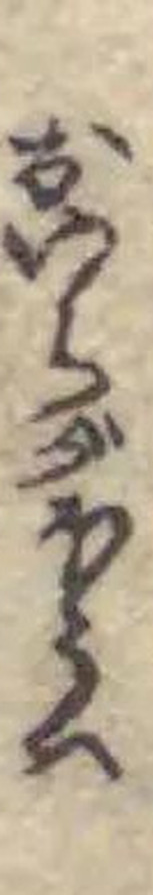おいらがほうハ
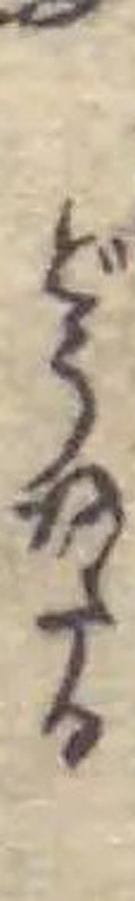どうあたる
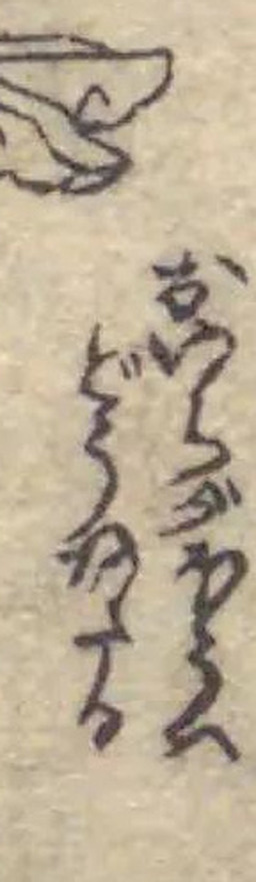どうあたる
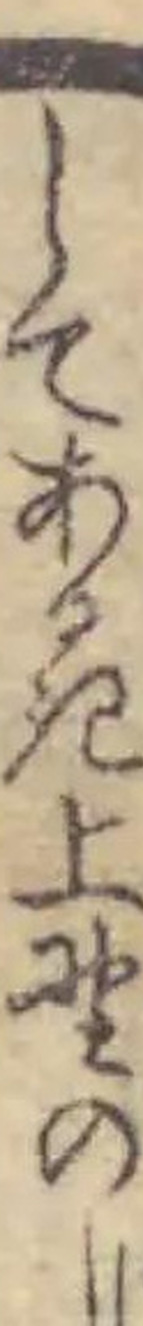してあるき上野の
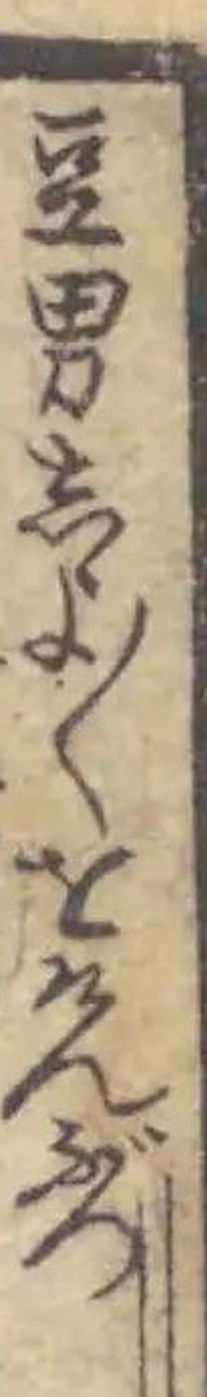豆男しよ〳〵をけんぶつ
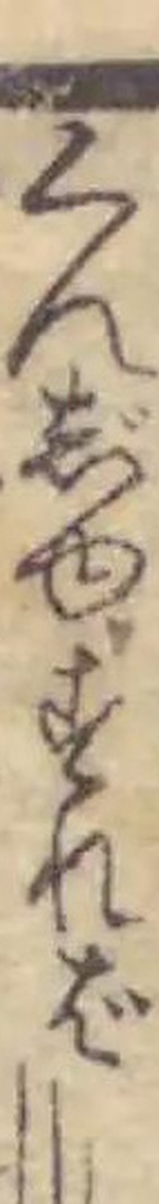くんじゆすれば
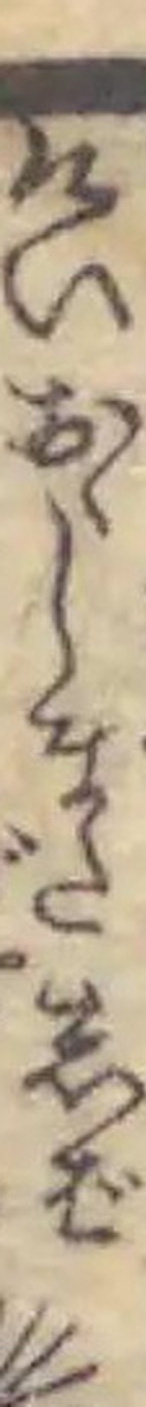けいおゝしまたしば
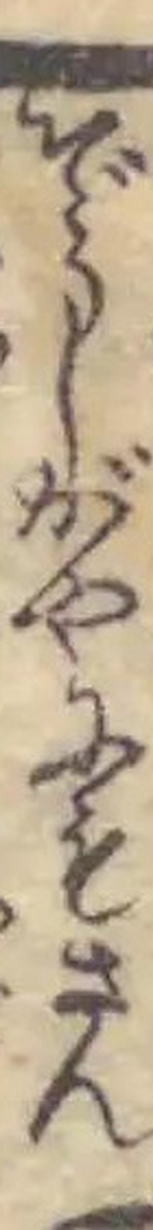ぞうしがやにもさん
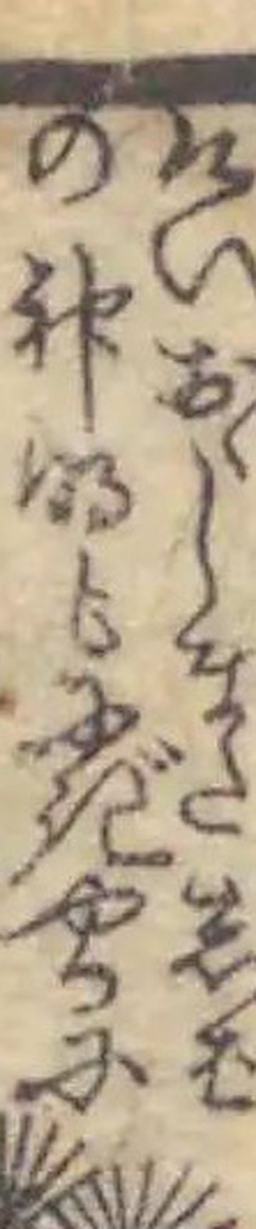の神明もにぎやかに
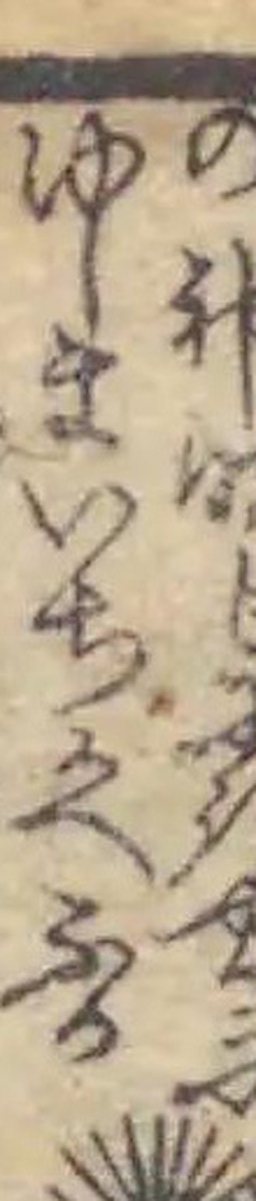ゆしまいちかへふか
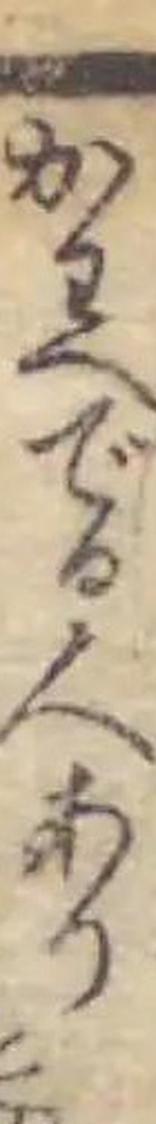かわへでる人あり
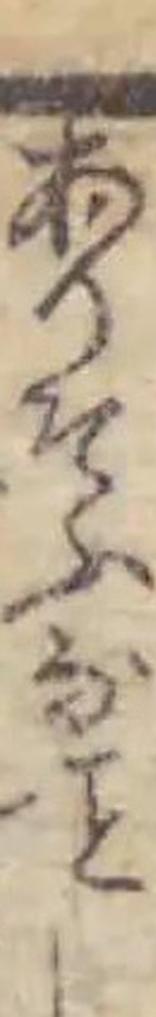ありそふなこと
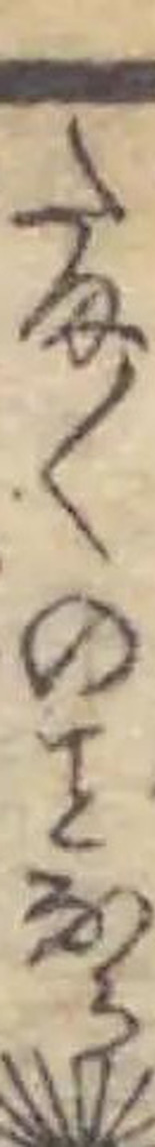たま〳〵のことなら
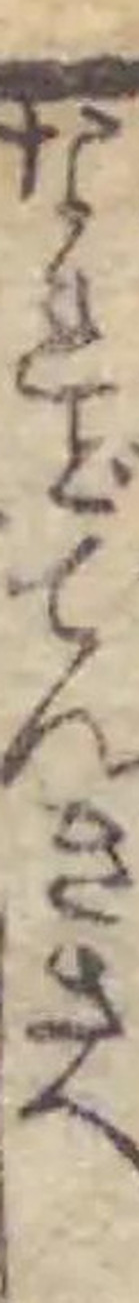なれどてんきさへ
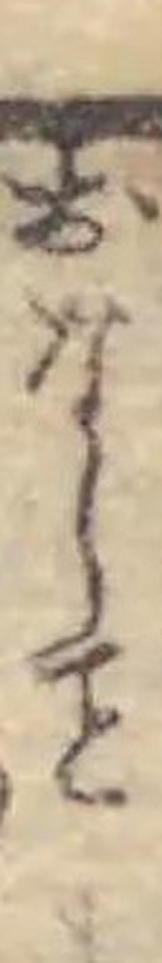おなしこと
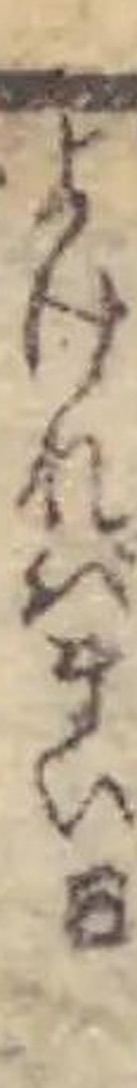よけれバまい日
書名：豆男江戸見物 2巻
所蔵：国立国会図書館 National Diet Library, JAPAN
